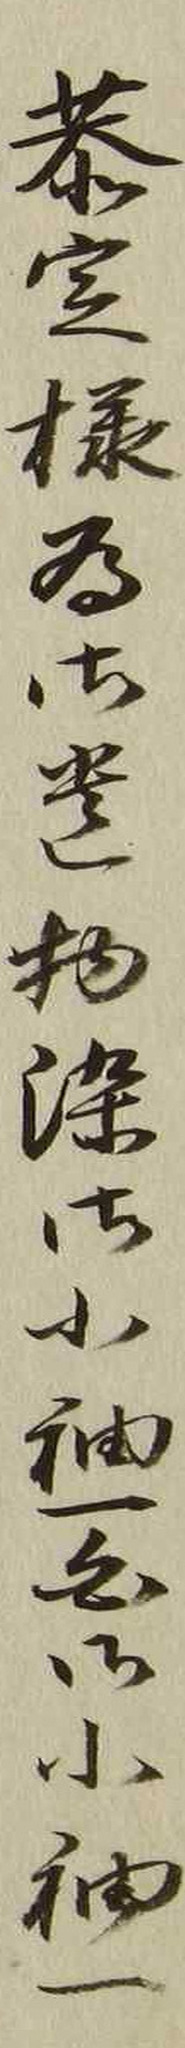恭定様為御遺物染御小袖一白小袖一
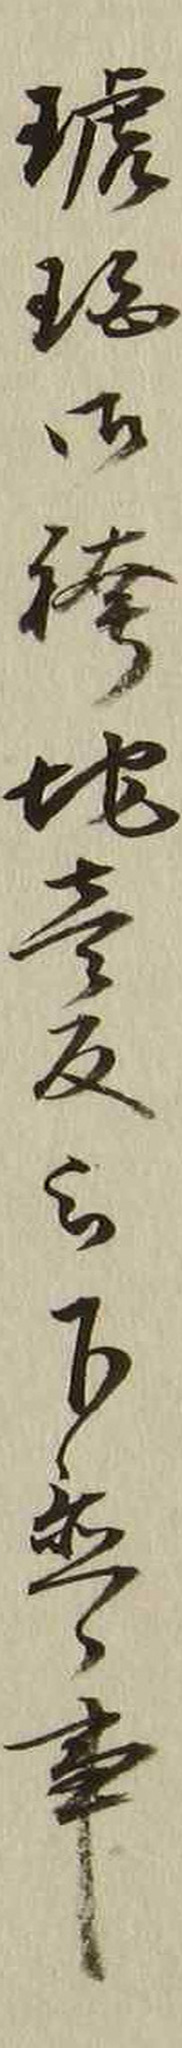琥珀御袴地壱反被下置候事
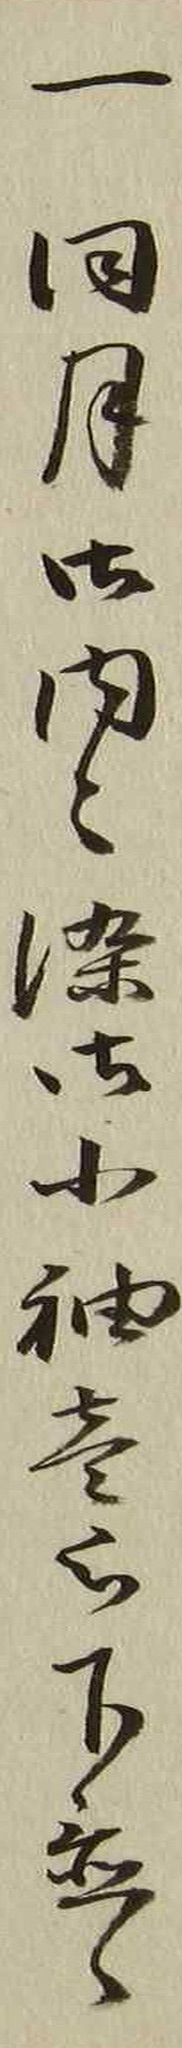一同月御内々染御小袖壱被下置候
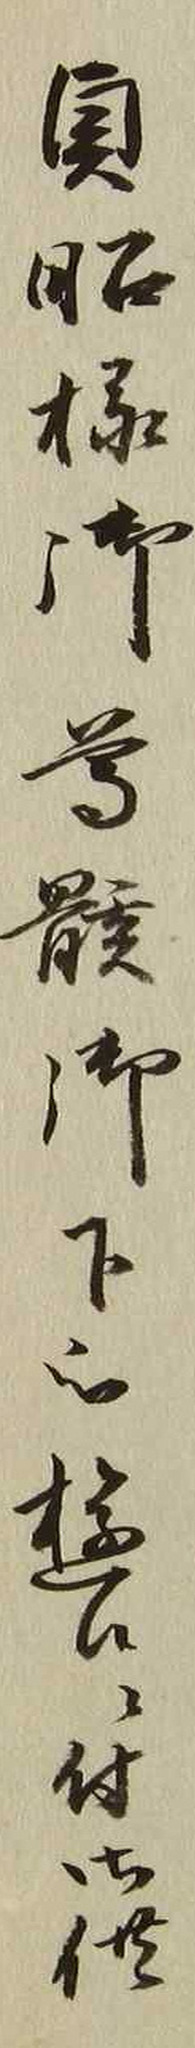貞昭様御尊骸御下被遊候ニ付御供
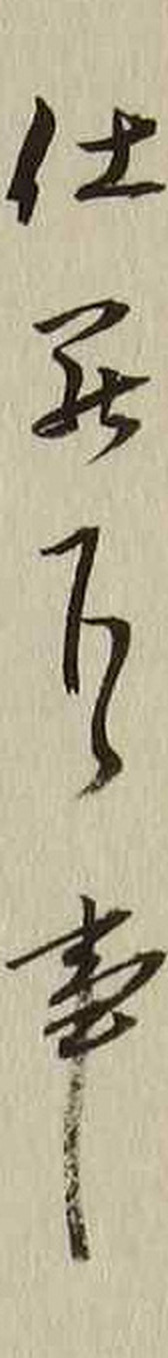仕罷下候事
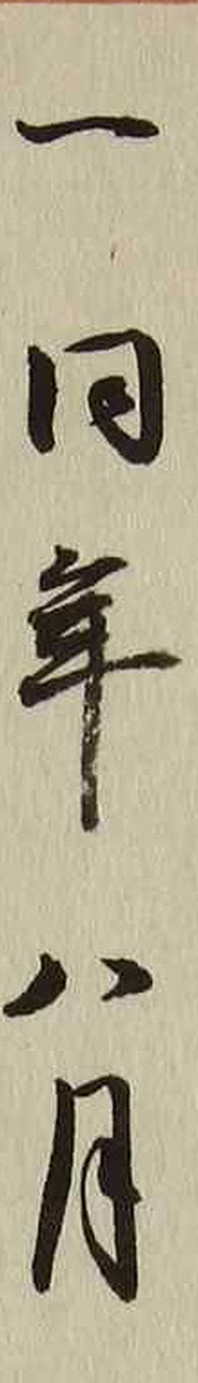一同年八月
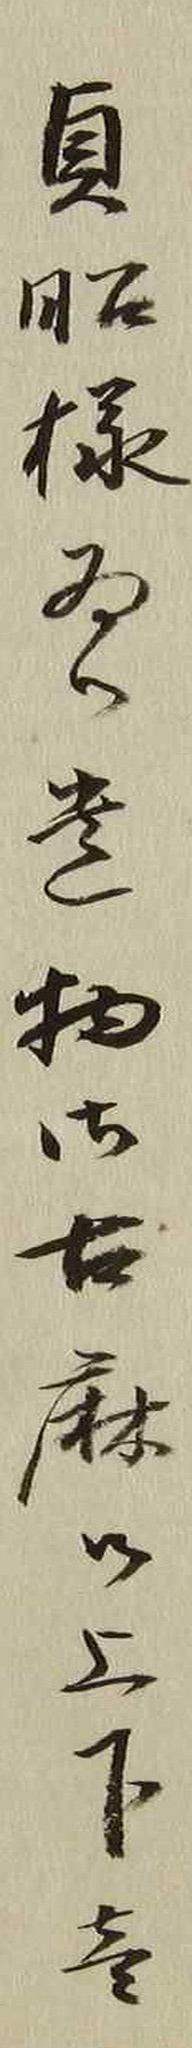貞昭様為御遺物御古麻御上下壱
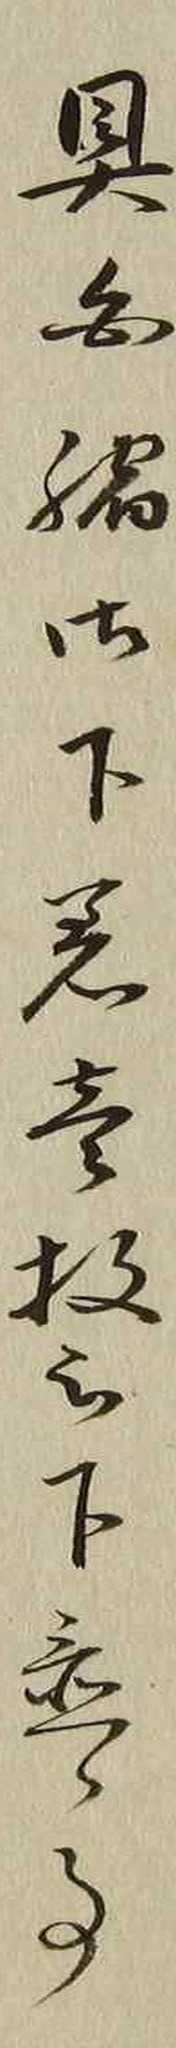具白縮御下着壱枚被下置候事
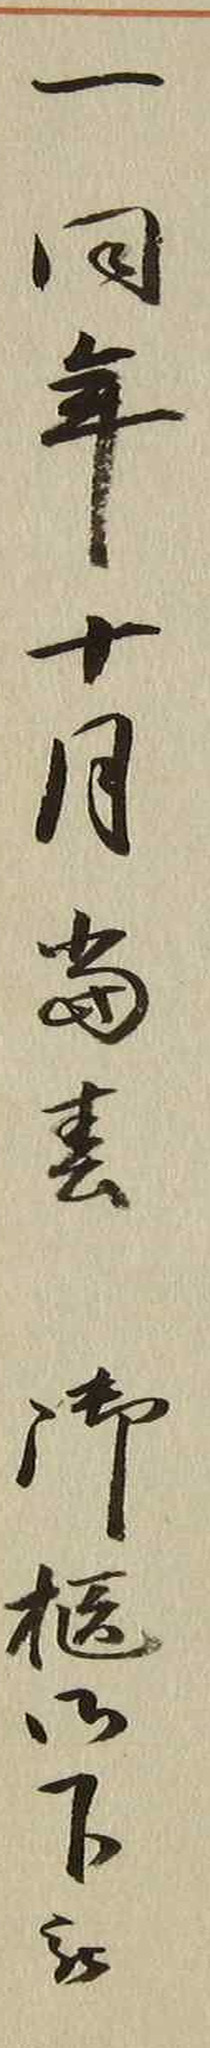一同年十月当春御柩御下被
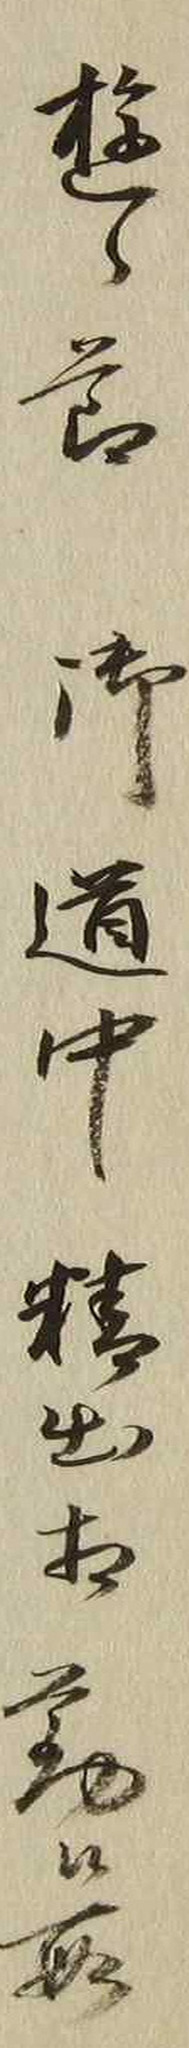遊候節御道中精出相勤候段
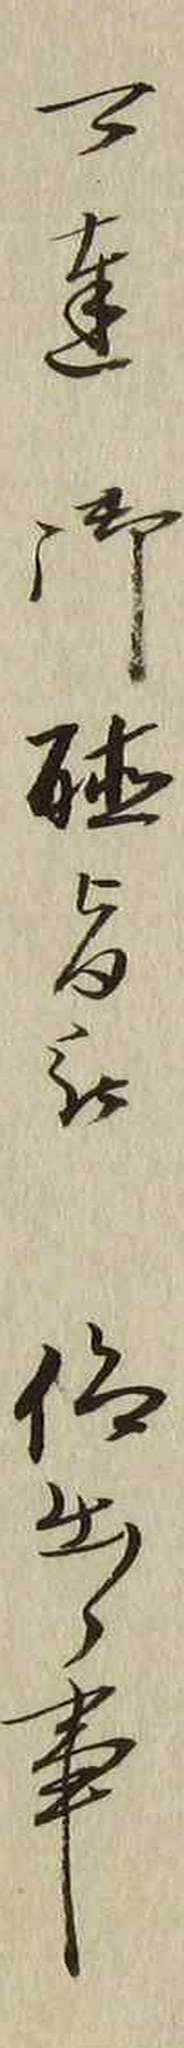可達御聴旨被仰出候事
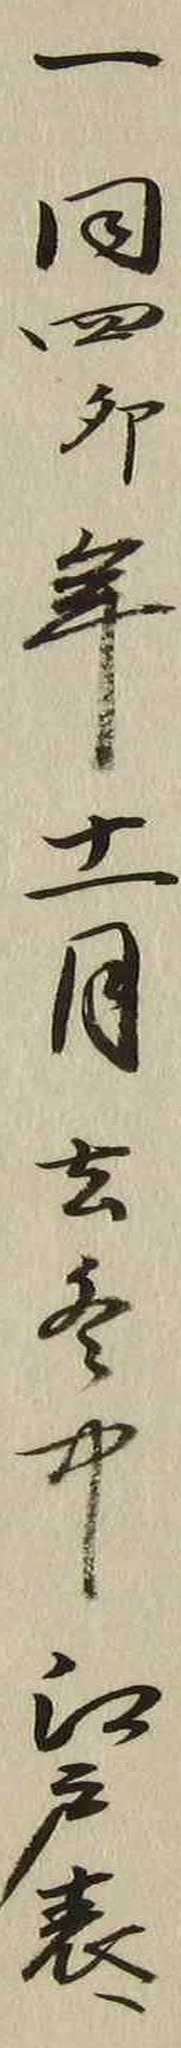一同四卯年十一月去冬中江戸表へ
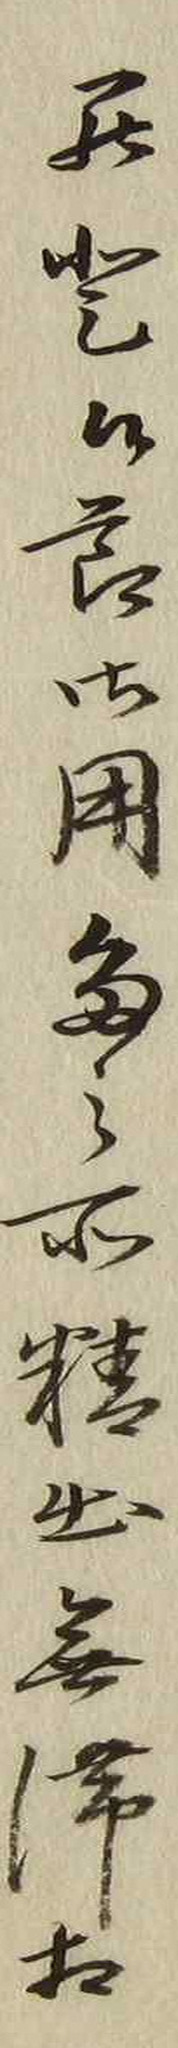罷登候節御用多之所精出無滞相
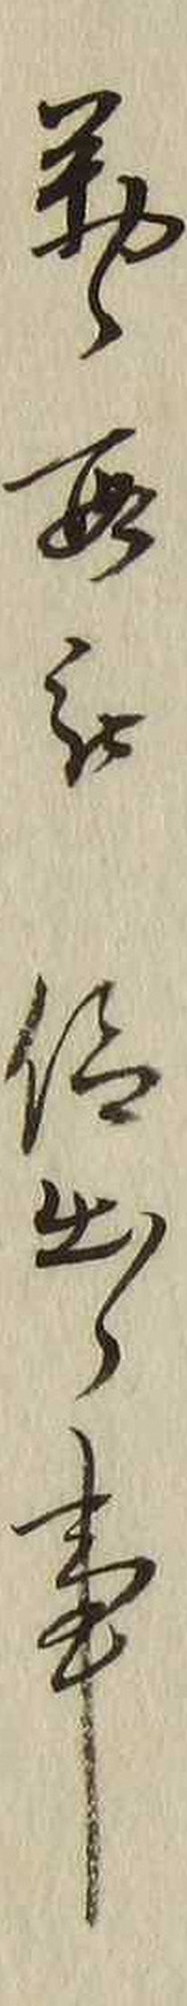勤候段被仰出候事
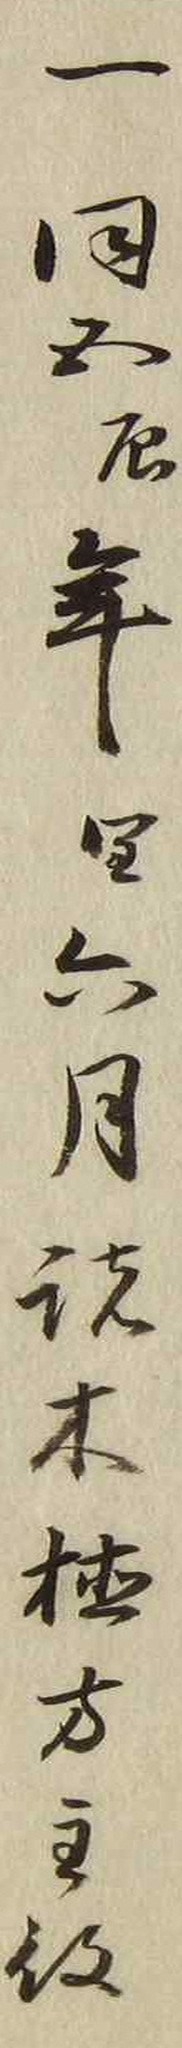一同五辰年閏六月諸木植方主役
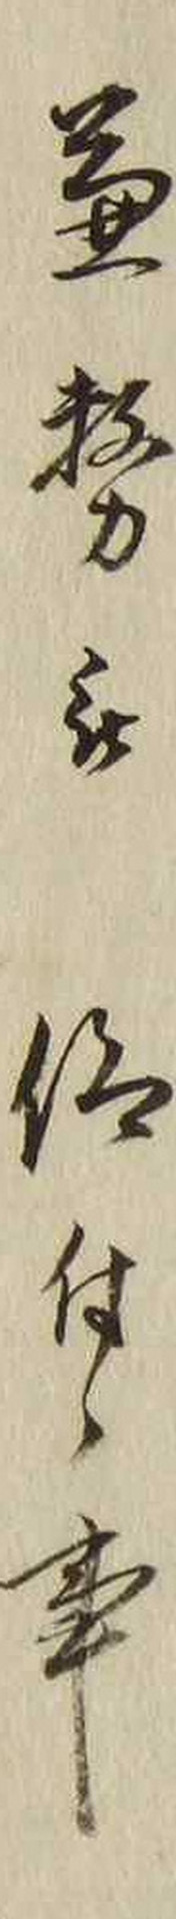兼務被仰付候事
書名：諸士系譜　巻之69　を之部3
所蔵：会津若松市立会津図書館
